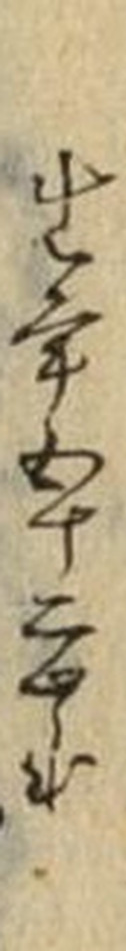生年五十二歳
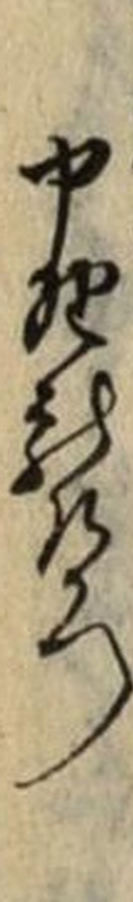中野新左衛門
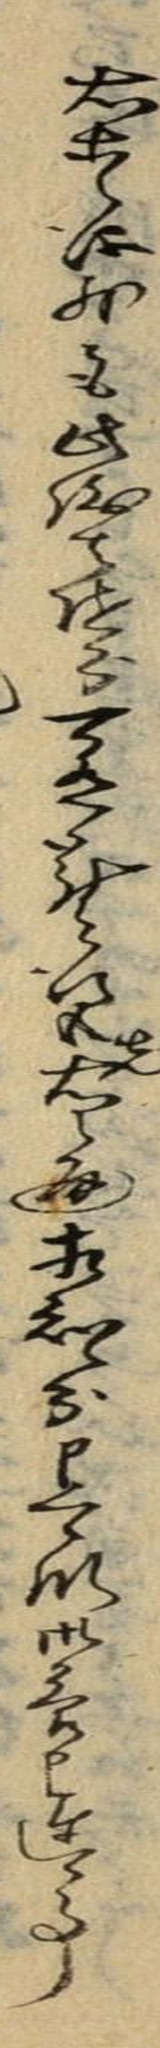右等之儀外二も此例者随分可有御座候得共先右之通相知候分申上候段御答申達候事
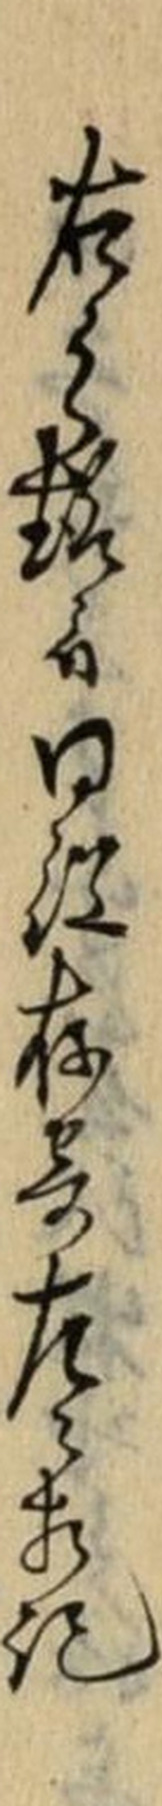右之趣二付同役存寄左二相記
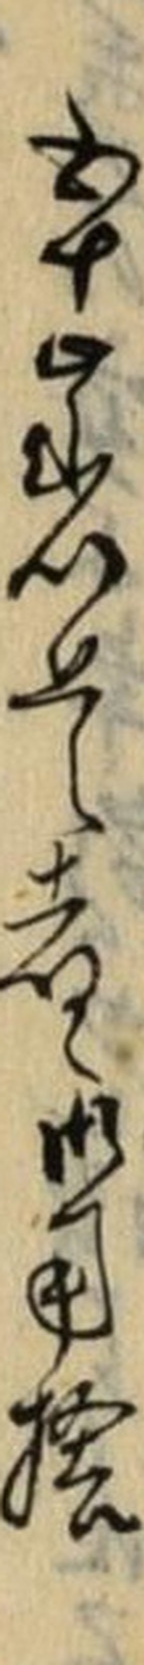五十歳以上の者ヘ御用捨
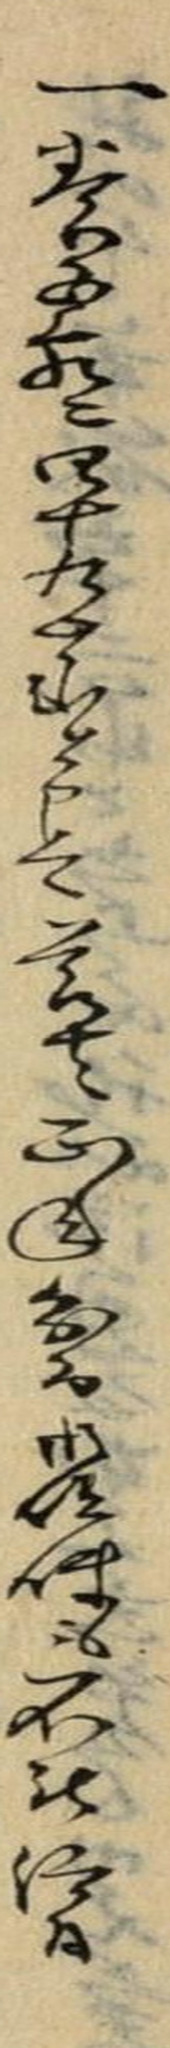一養子願二四十九歳と申上候節者正年分而御吟味も不被仰付
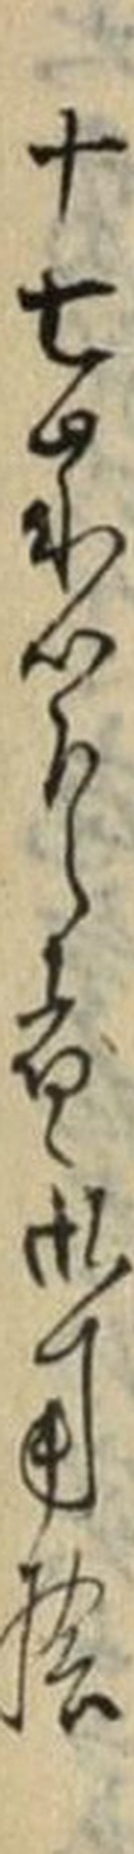十七歳以下之者へ御用捨
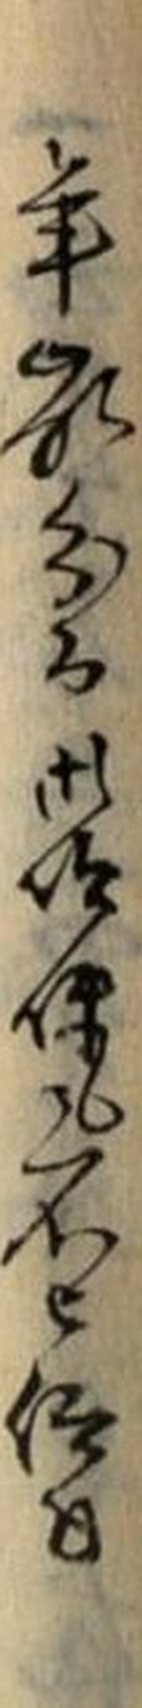年齢分而御吟味も不被仰付
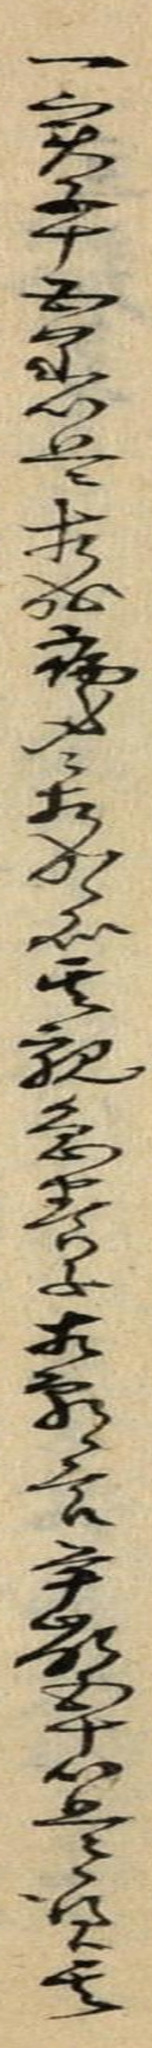一実子十五歳以上ニ相成病身二相成候処其親急養子相願候節年齢五十以上ニ候得ハ其
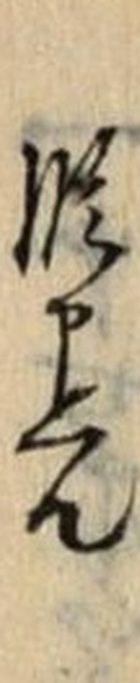段申上ル
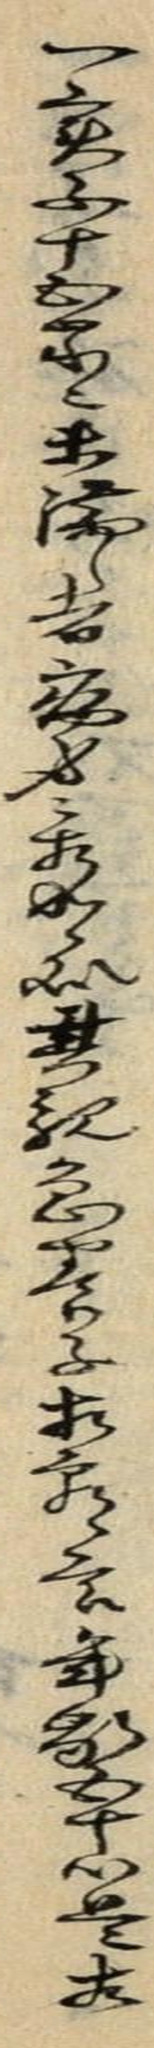一実子十五歳ニ未満之者病身ニ相成候処其親急養子相願候節年齢五十以上ニ相
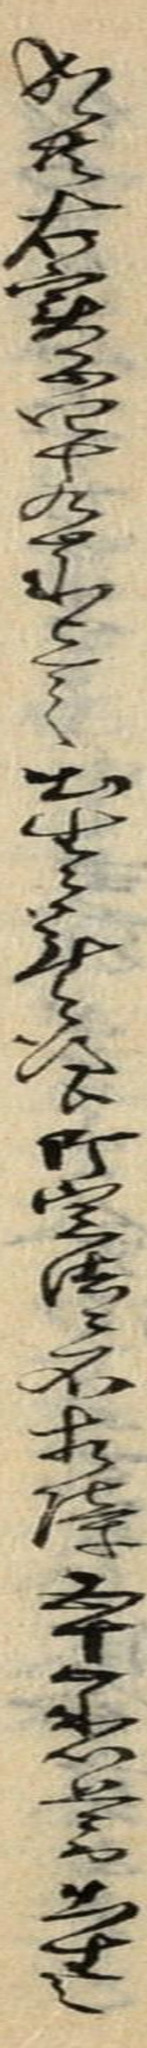成候共右実子四十九歳迄之出生ニ御座候得ハ町定法ニ不相障五十歳以上ニ而出生之
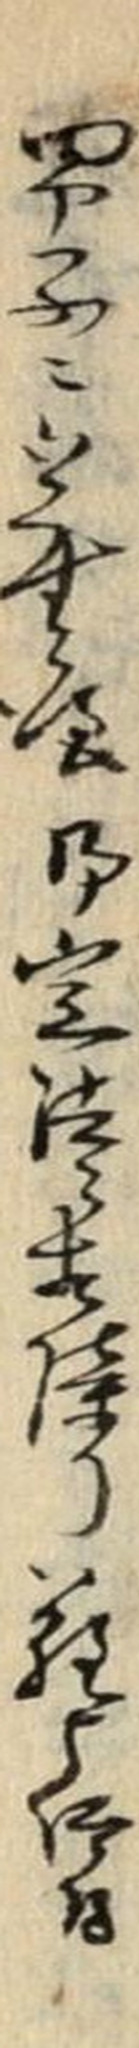男子ニ御座候得ハ御定法ニ相障り難被仰付
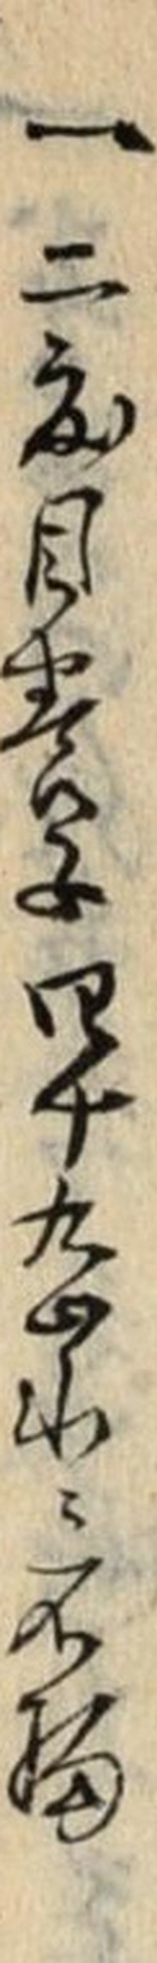一二度目養子四十九歳に不拘
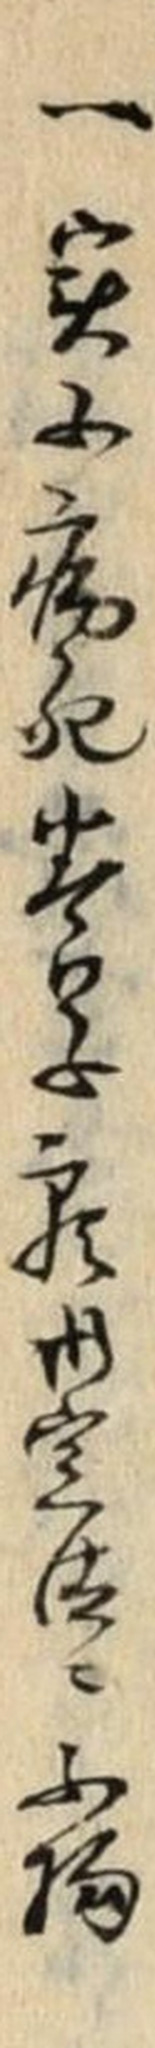一実子病死養子願御定法ニ不拘
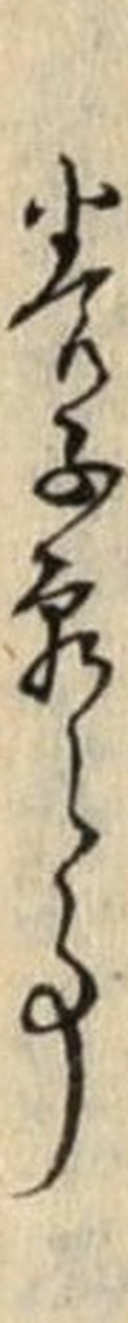養子願之事
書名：養子縁組之部
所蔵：福井県文書館 Fukui Prefectural Archives
